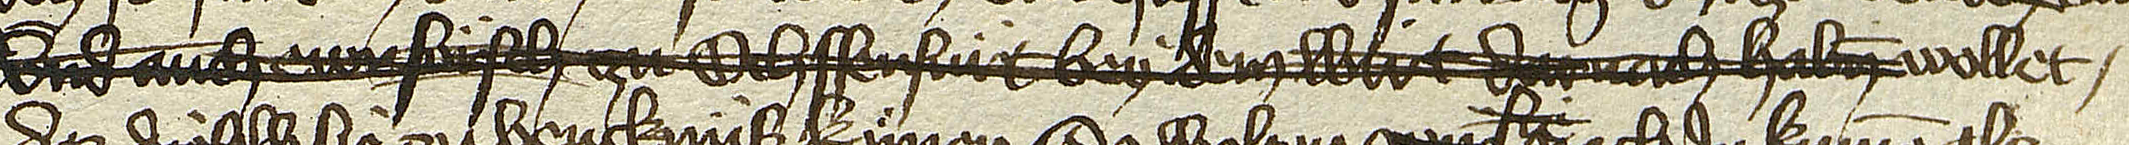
vnd auch ewn förſch cʒu Ochſſenfürt bey dem wirt darnach habn* wollet /
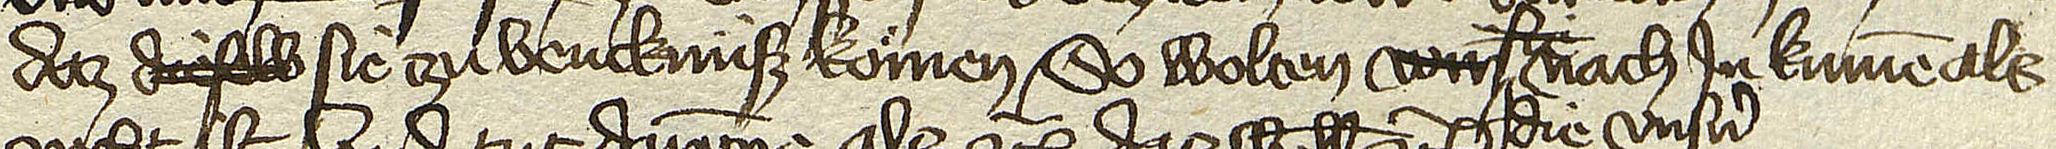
daʒ dieſelb ſie cʒu vencknüſʒ kömen / So wolten wir nach In kume* als
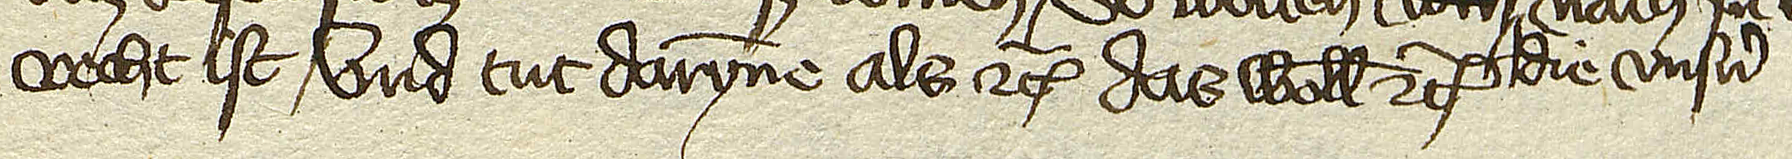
recht iſt / vnd tut daryne* als ec* das woll* ec* die vnſn*
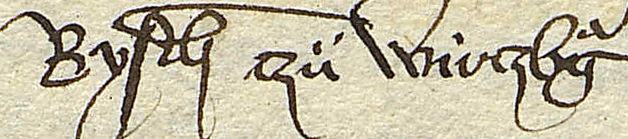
Byſch* cʒü Wircʒb*g
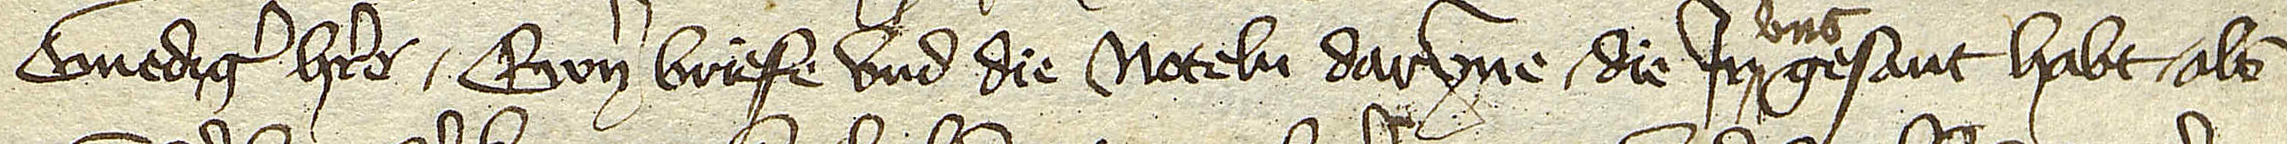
Gnedig* hr*e / Ewn* brief vnd die Noteln daryne* / die Ir geſant habt / als
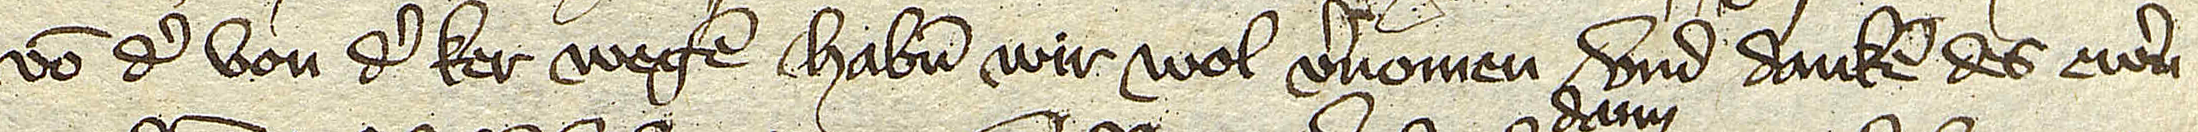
vo* d* von d* ker wege* / habn* wir wol v*nomen / Vnd danke* des ew*n
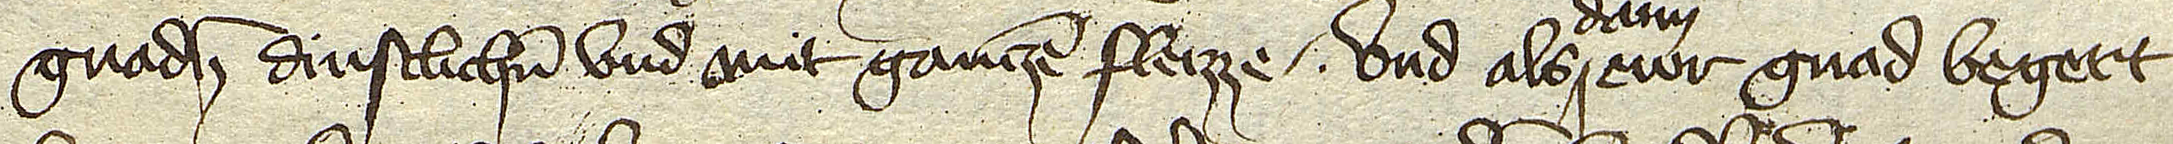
gnadn* / dinſtlichn* vnd mit gancʒe* fleiʒʒe / . vnd als ewr gnad begert
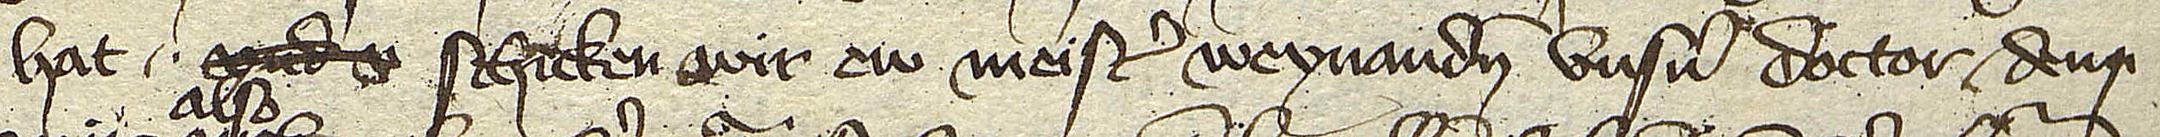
hat / . vnd v ſchicken wir ew meiſt* weynandn* vnſn* Doctor / dem
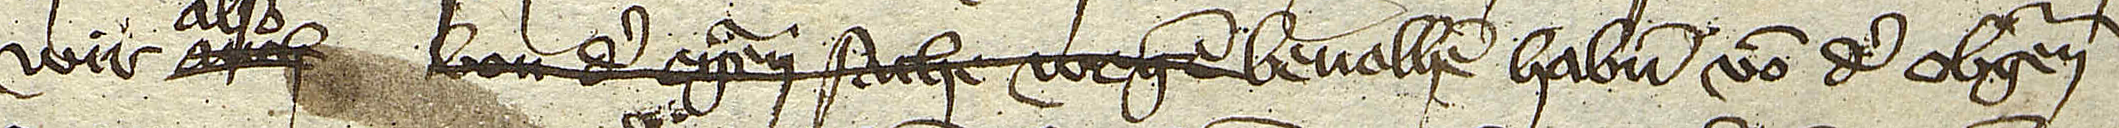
wir auch von d* egen* ſache wege* beuolhe* habn* vo* d* obgen*
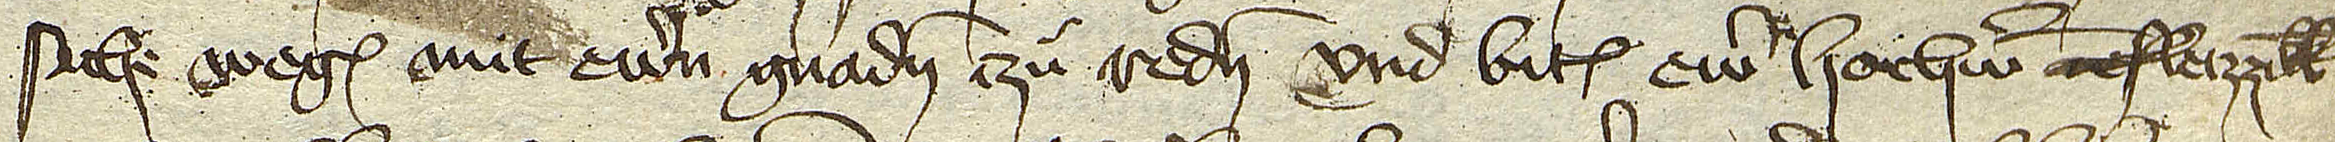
ſache weg* mit ew*n gnadn* cʒü redn* vnd bit* ew* hochw* refleiʒʒikl*
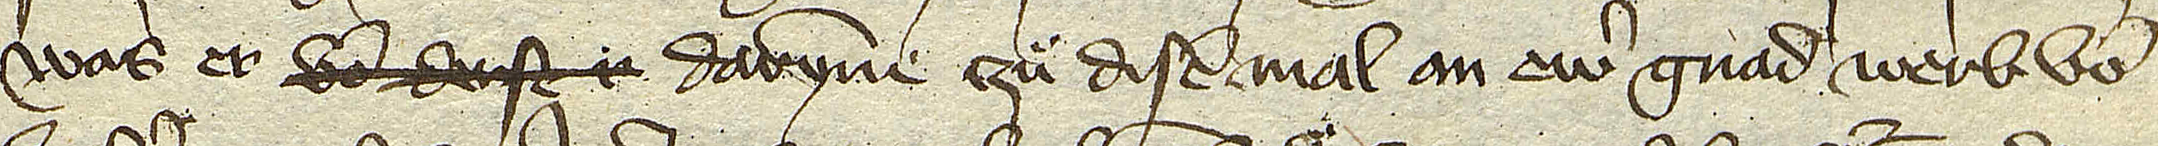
was er vo* der ſa in daryne* cʒü diſe* mal an ew* gnad werb vo*
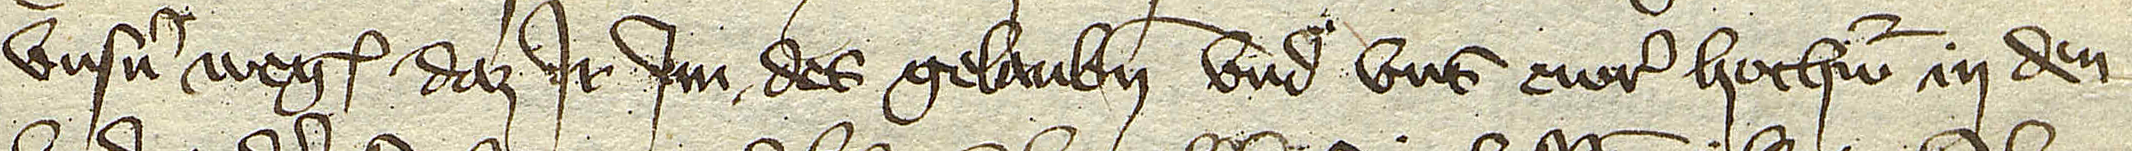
vnſn* weg* / daʒ Ir Im des gelaubn* vnd vns ewr* hochw* in den
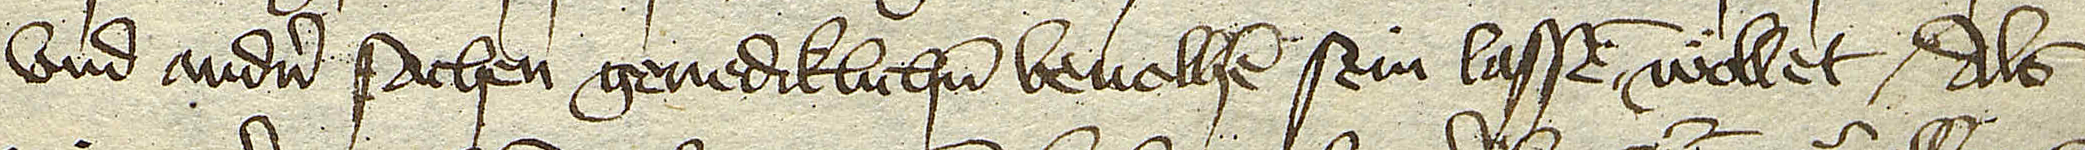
vnd andn* ſachen genediklichn* beuolhe* ſein laſſe* wöllet / Als
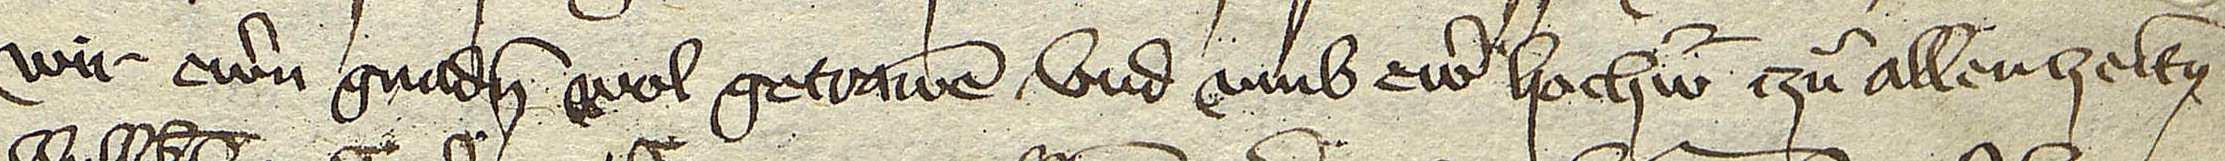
wir ewn* gnadn* wol getrawe* / vnd vmb ew* hochw* cʒü allencʒeitn*
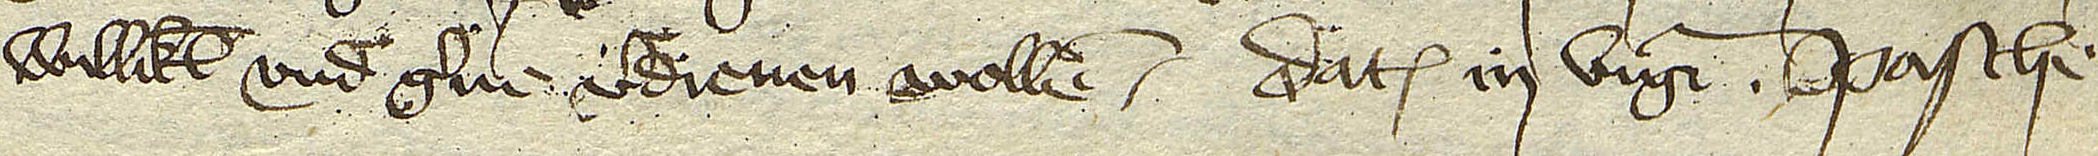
willikl* vnd g*ne v*dienen wolle* / Dat* in vigi* . Paſche
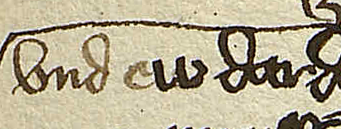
vnd ew dar
